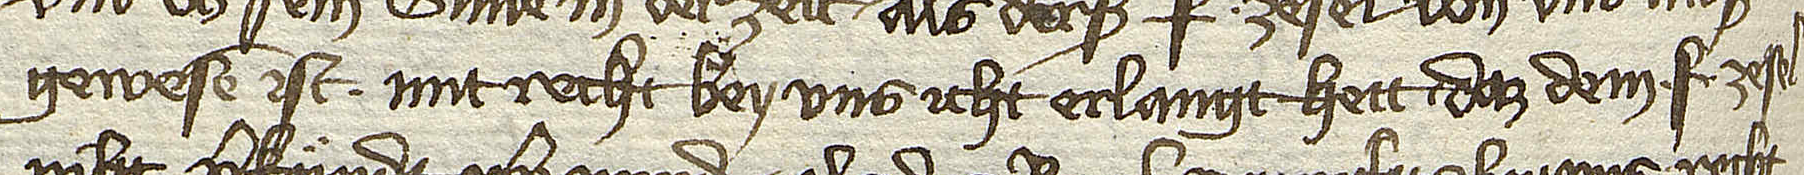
geweſe* iſt . mit recht bey vns icht erlangt hett / daʒ dem . f . ʒeſel
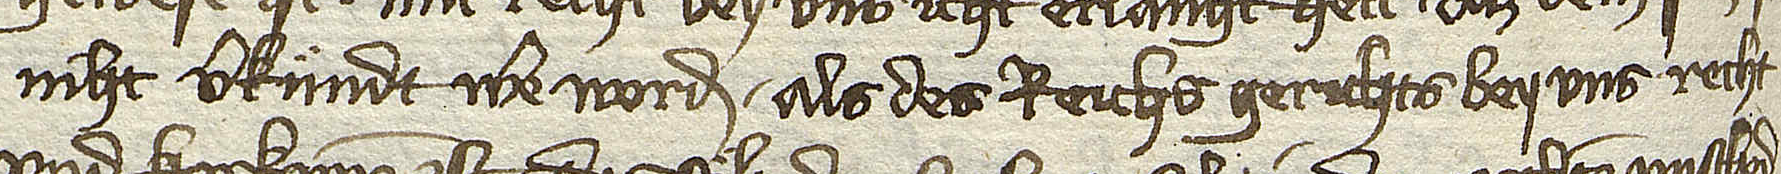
niht v*kündt w*e word* / als des Reichs gerichts bey vns recht
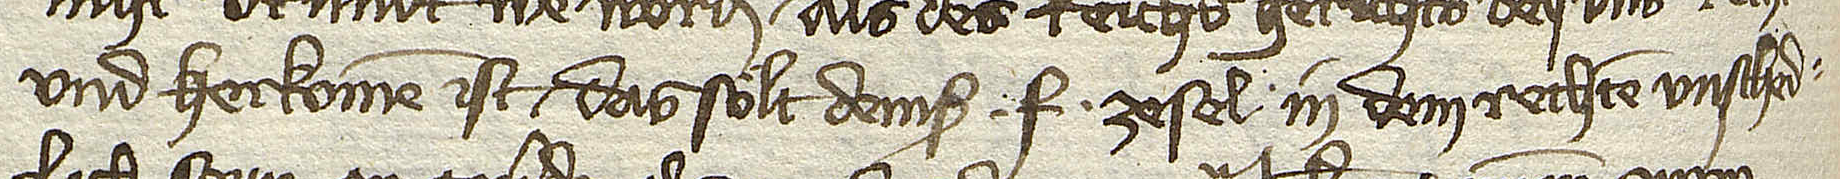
vnd herkome* iſt / das ſölt demſ* . f . ʒeſel in dem rechte* vnſched =
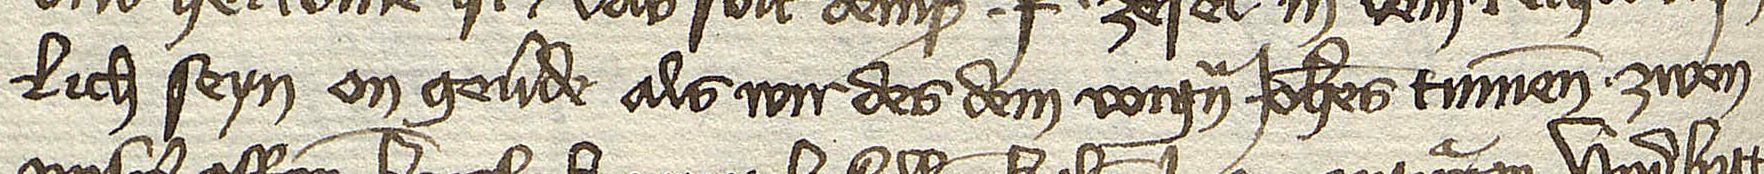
lich ſeyn on geu*de als wir des dem vorgn* Iohes* tum*en . ʒwen
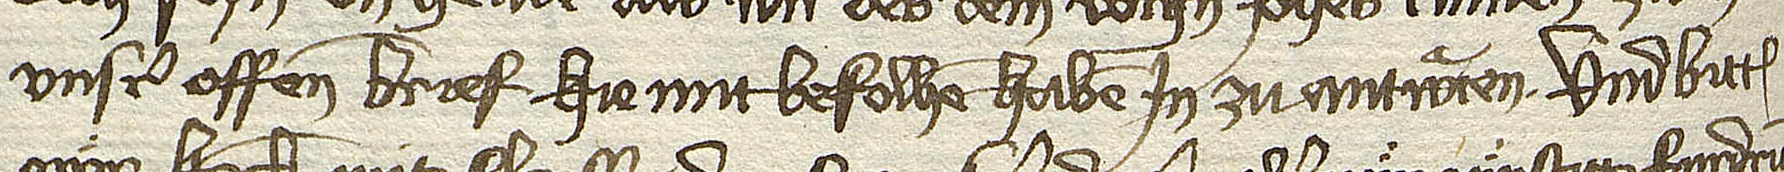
vnſr* offen* brief hiemit befolhe* habe* In ʒu antw*ten . Vnd bitt*
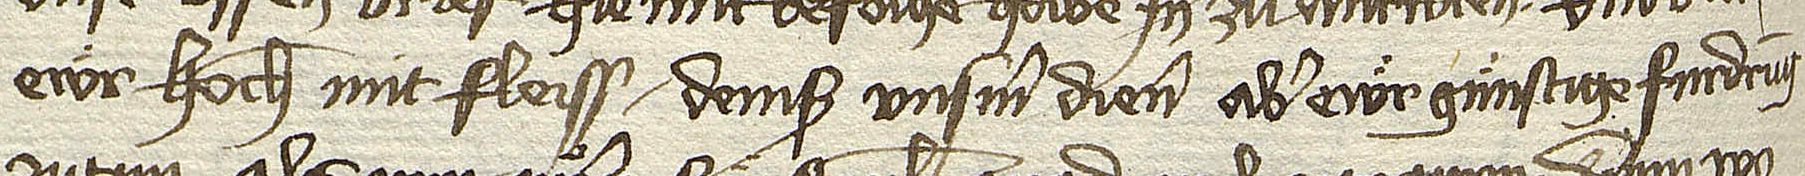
ewr hoch* mit fleiſſ / demſ* vnſ*m dien* ab* ewr günſtige furdrug*
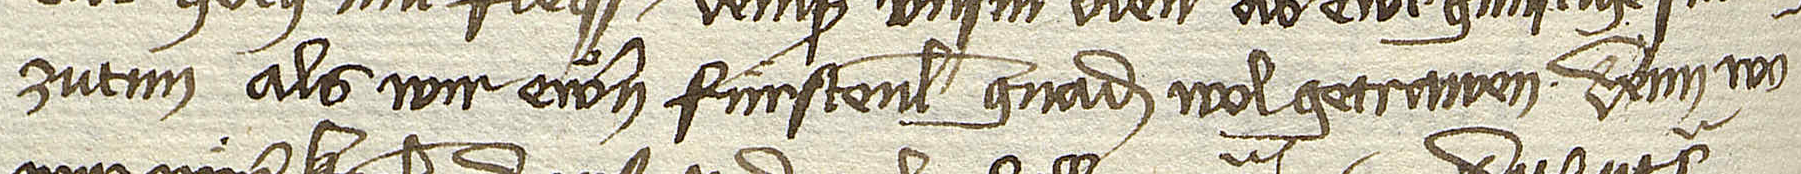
ʒutun als wir ewn* fürſtenl* gnad* wol getrawen . Denn wo
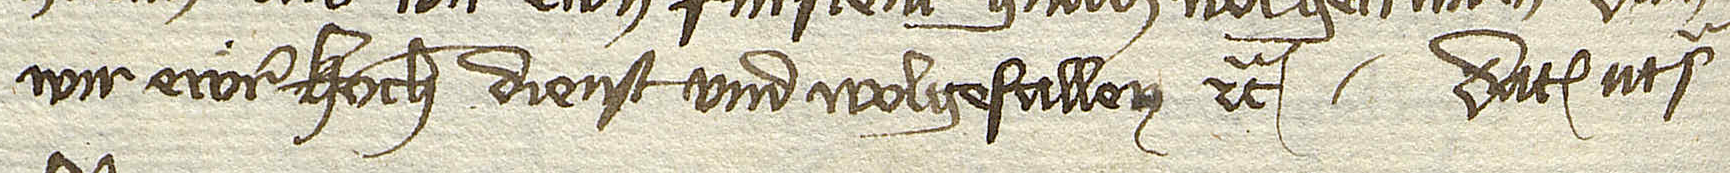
wir ewr* hoch* dienſt vnd wolgefallen ec* / Dat* ut* ſ*
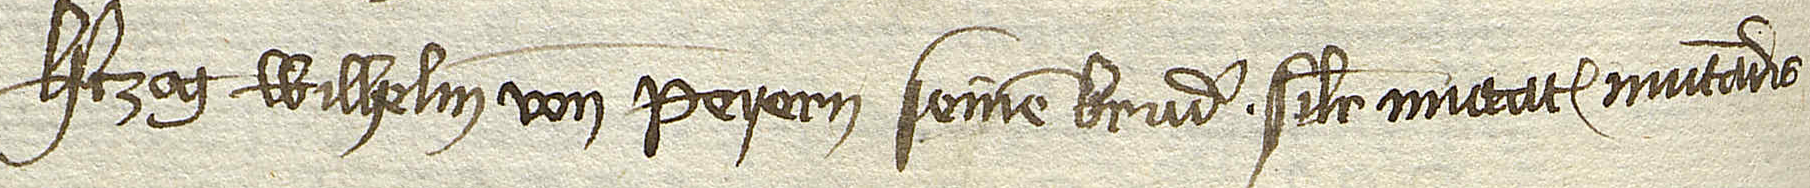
H*cʒog Wilhelm von Peyern ſeine* brud* . ſilr mutat* muta*dis
